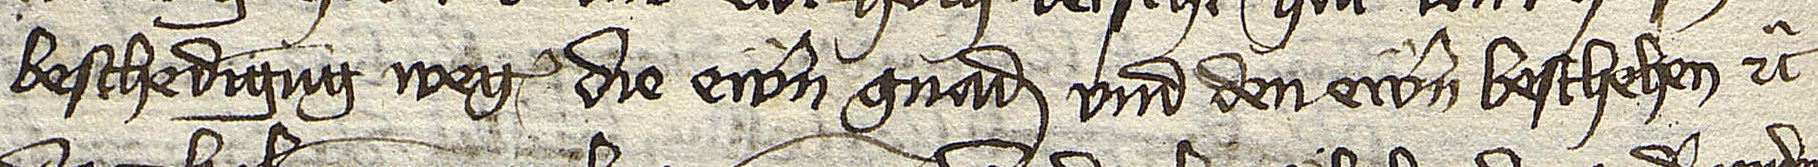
beſchedigu*g weg* die eẅ*n gnad* vnd den eẅ*n beſchehen ec*
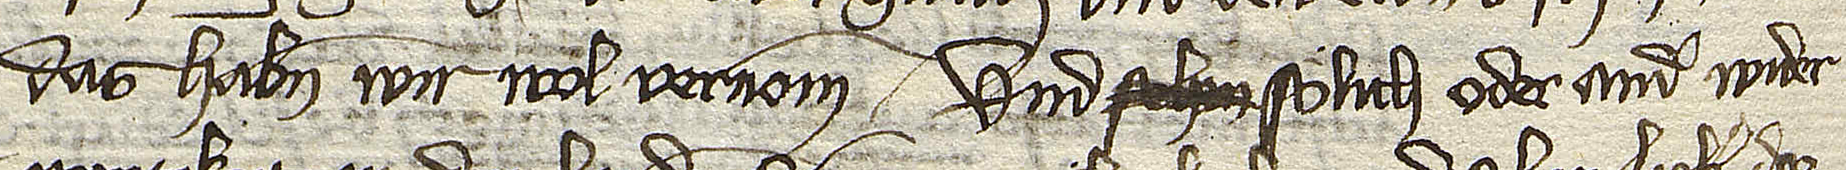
Das habn* wir wol vernom* / Vnd ſehen ſölich oder and* wider
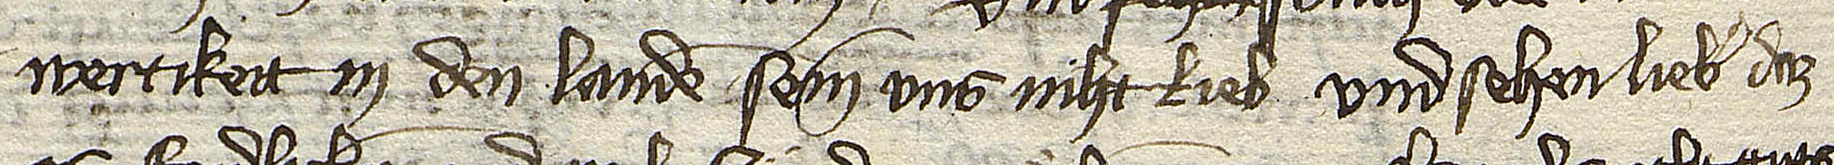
wertikeit in den lande* / ſein vns niht lieb vnd ſehen lieb* daʒ
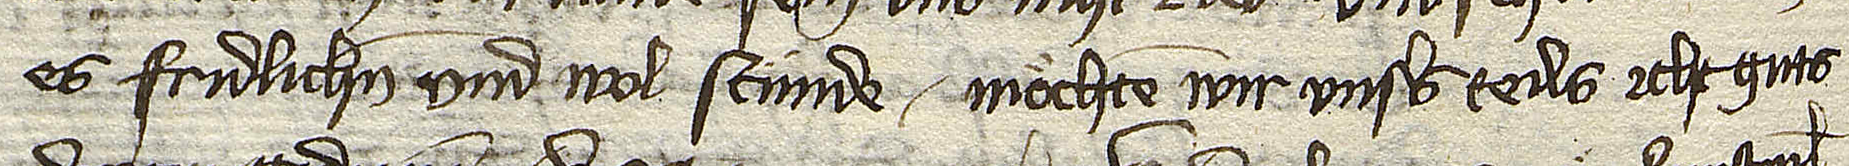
es fridlichn* vnd wol ſtünde / möchte* wir vnſ*s teils icht guts
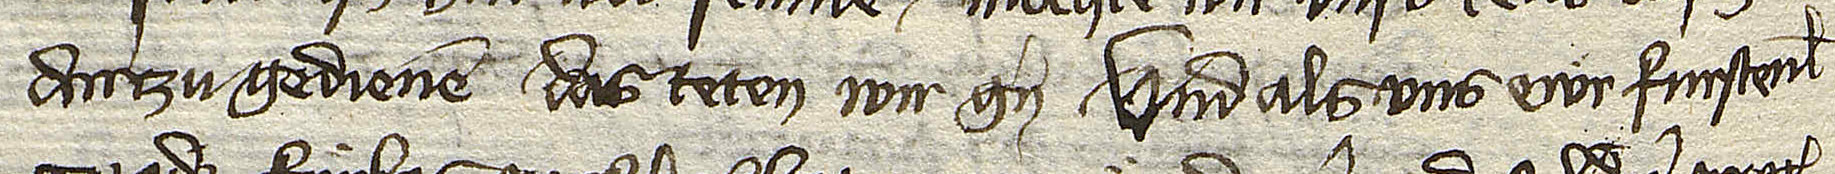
darcʒu gediene* / das teten wir g*n / Vnd als vns eẅr furſtenl*
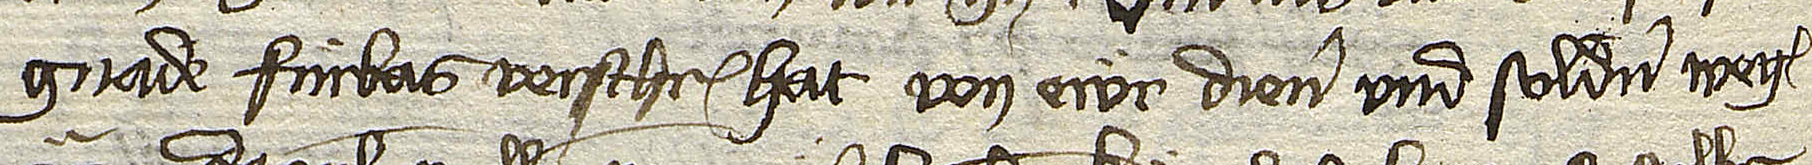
gnade fürbas verſchr* hat von eẅr dien* vnd ſoldn* weg*
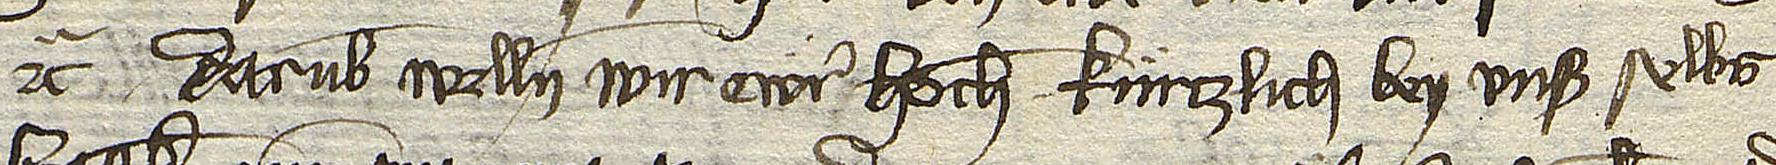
ec* / Darub* welln* wir eẅr* hoch* kürcʒlich bey vnſ* ſelbs
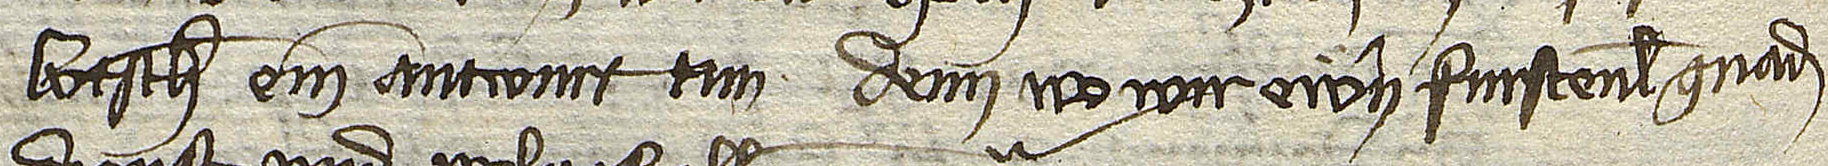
botſch* ein* antwurt tun . Denn wo wir eẅ*n furſtenl* gnad*
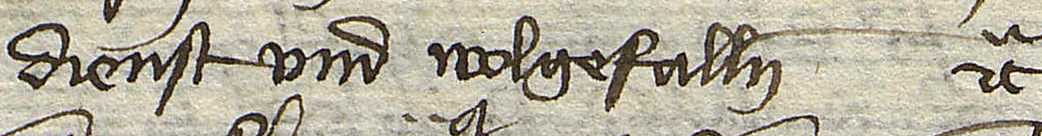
dienſt vnd wolgefalln* ec*
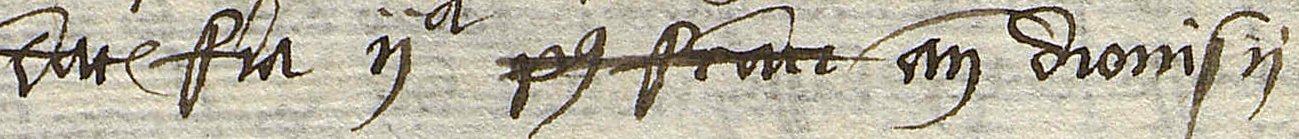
Dat* fi*a ii* p* fran*ci an* dioniſii
